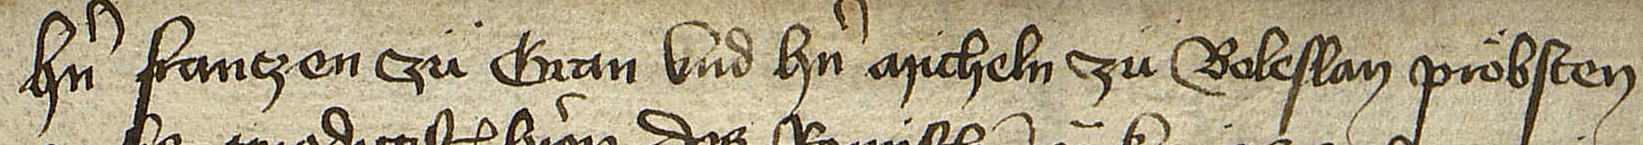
hn* francʒen cʒü Gran vnd h*n Micheln cʒü Boleſlan pröbſten
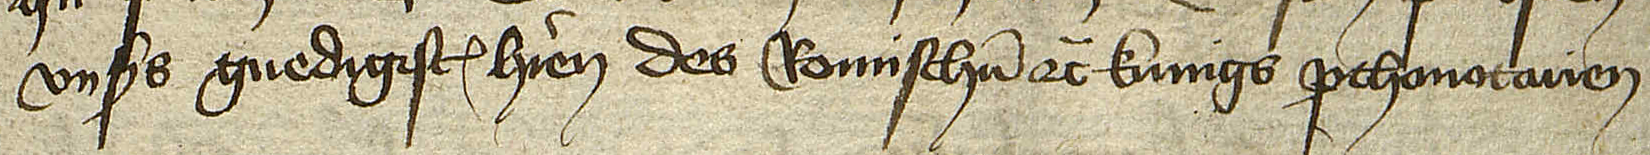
vnſ*s gnedigiſt* h*ren des Romiſch*n ec* kunigs p*thonotarien
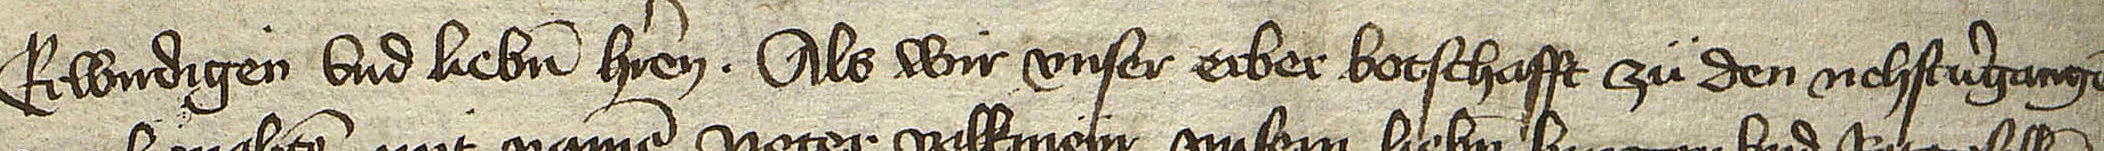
Erwirdigen vnd lieb*n h*ren . Als wir vnſer erber botſchafft cʒü den nehſtu*gange*
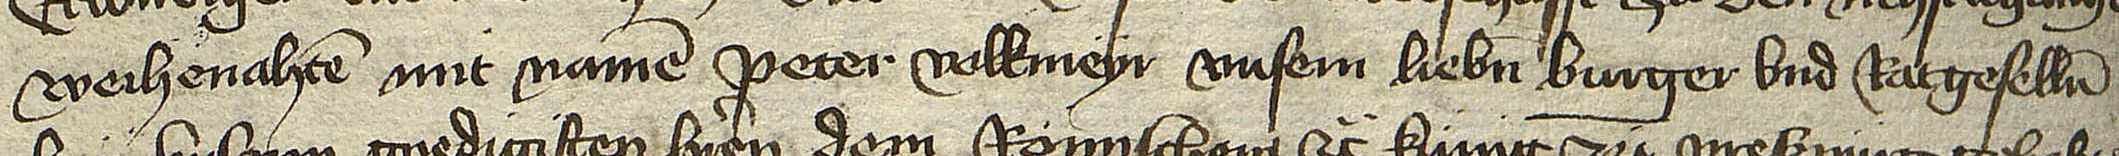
weihenahte* mit name* peter volkmeyr vnſern lieb*n burger vnd Ratgeſell*n
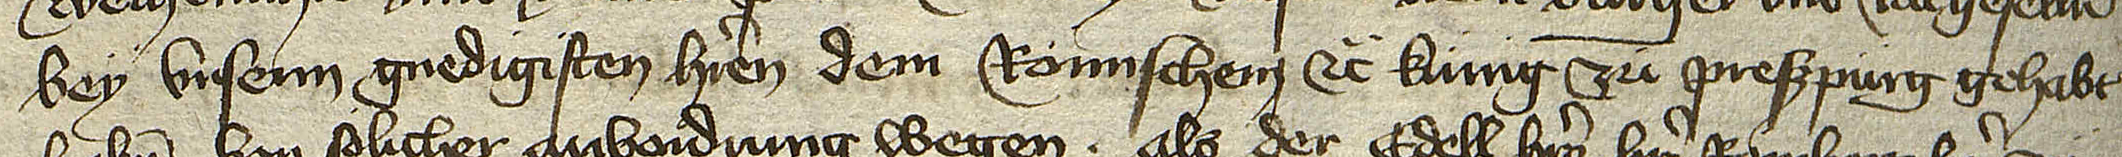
bey vnſerm gnedigiſten h*ren dem Römiſchem ec* künig cʒü preſʒpürg gehabt
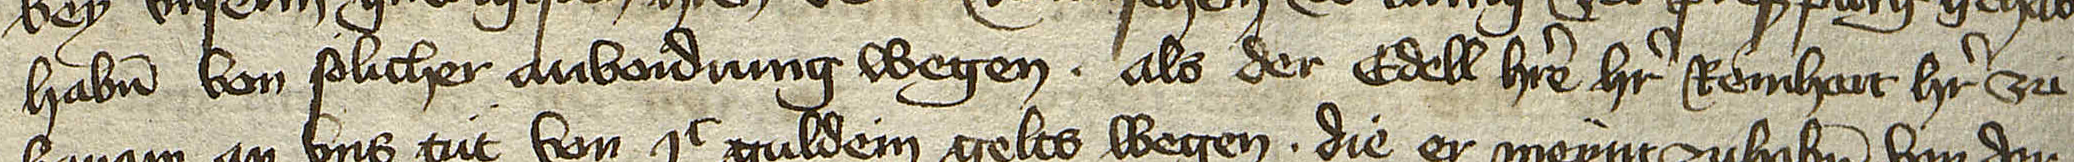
hab*n von ſölicher anvordrung wegen . als der Edell h*re h*r Reinhart h*r cʒü
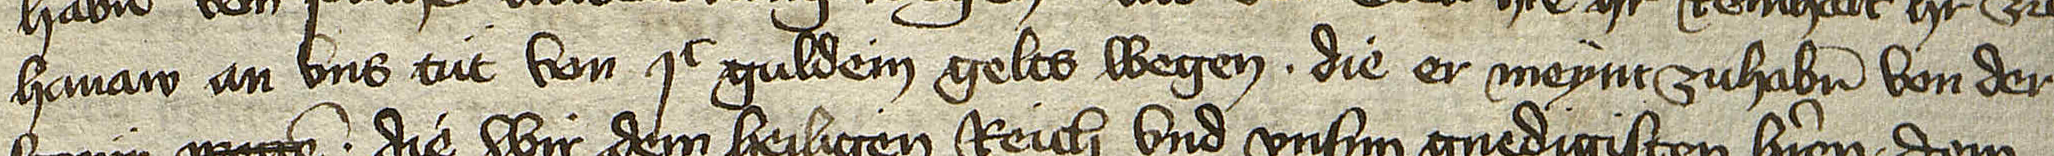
hanaw an vns tüt von i* gulden gelts wegen . die er meynt cʒuhab*n von der
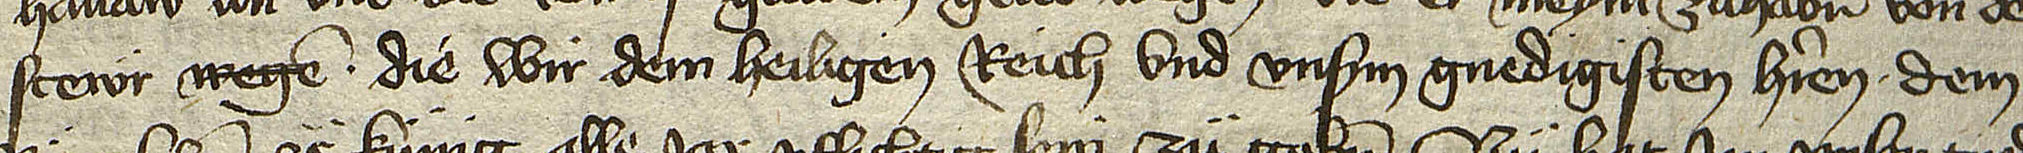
ſteẅr wege* . die wir dem heiligen Reich vnd vnſ*m gnedigiſten h*ren . dem
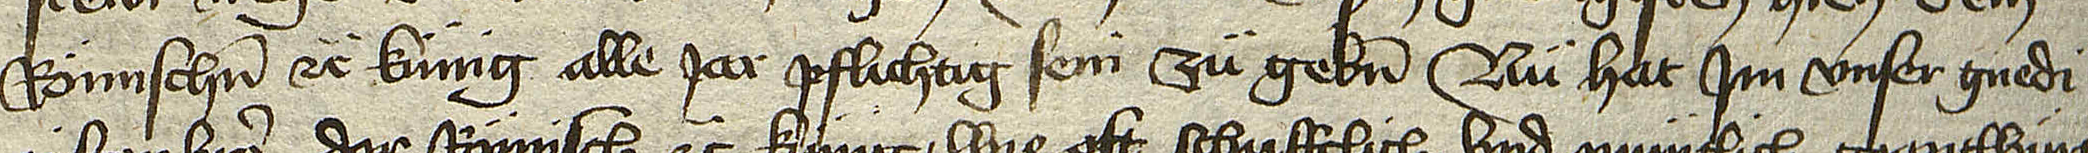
Römiſch*n ec* künig alle Iar pflichtig ſein cʒü geb*n Nü hat Im vnſer gnedi
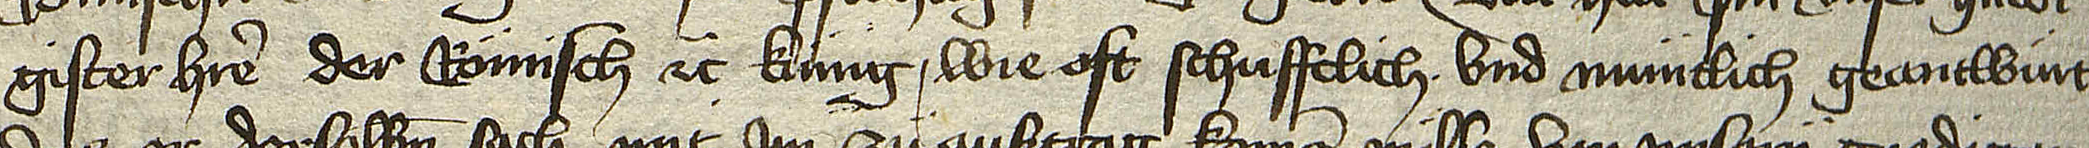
giſter h*re der Römiſch ec* künig / wie oft ſchrifftlich . vnd müntlich geantwürt
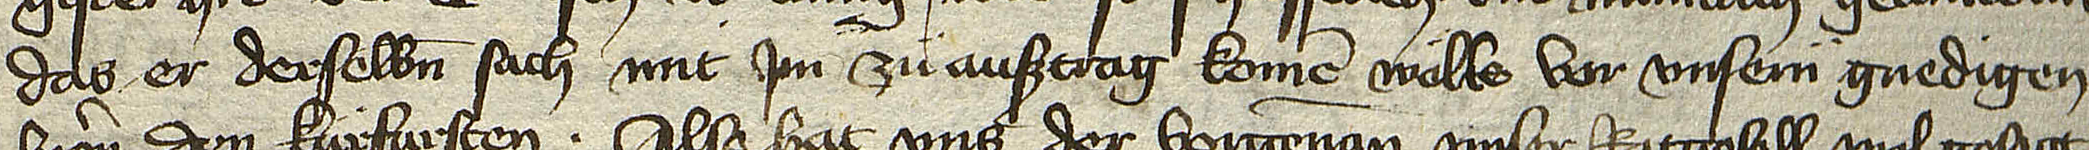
das er derſelb*n ſach mit Im cʒü auſʒtrag kome* wölle vor vnſern gnedigen
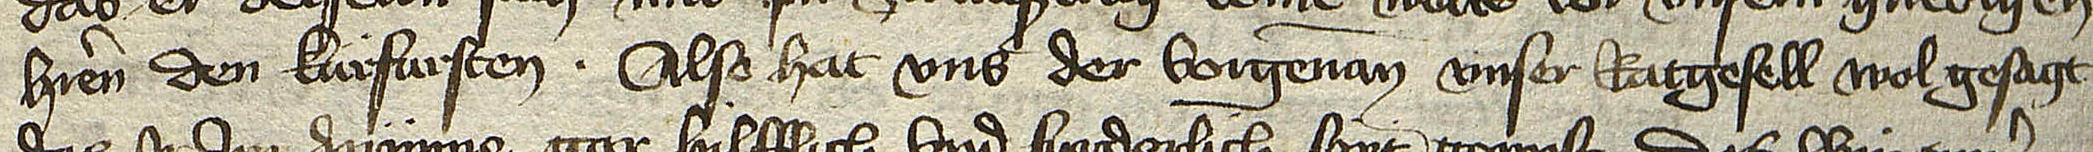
h*ren den kürfurſten . Alſo hat vns der vorgenan* vnſer Ratgeſell wol geſagt
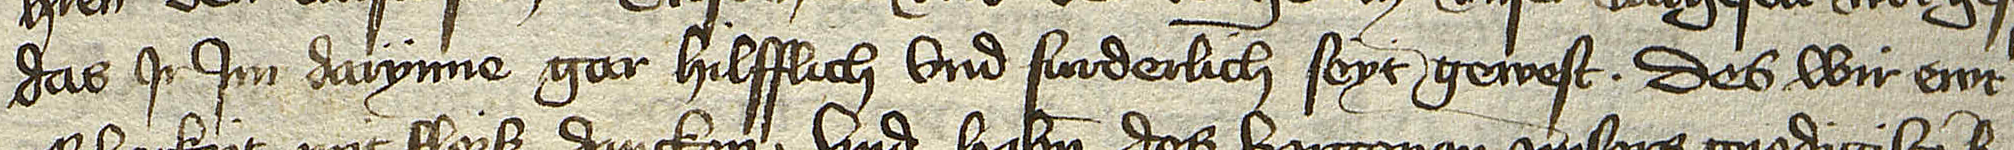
das Ir Im darynne gar hilfflich vnd furderlich ſeyt geweſt . Des wir ewr*
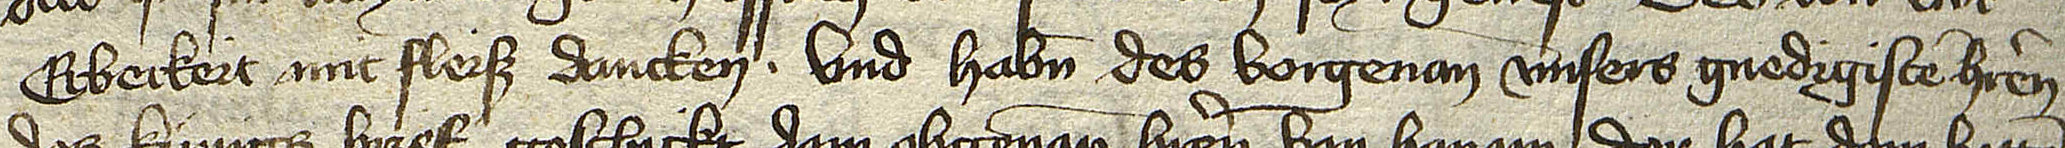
Erberkeit mit fleiſʒ dancken . Vnd hab*n des vorgenan* vnſers gendigiſte* h*ren
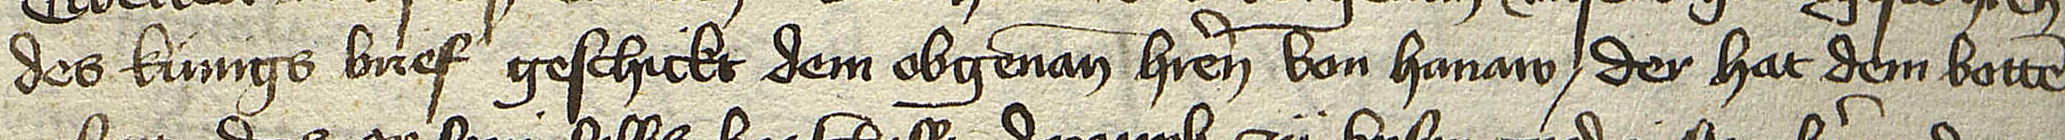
des künigs brief geſchickt dem obgenan* h*ren von hanaw / der hat dem botte*
